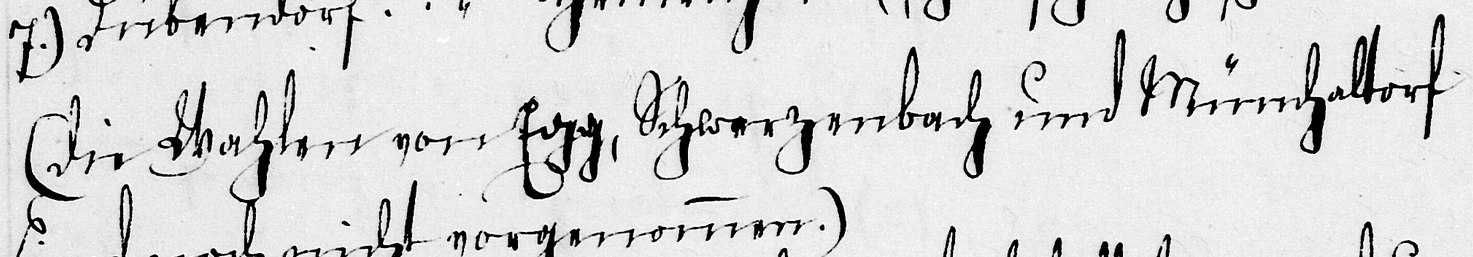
(Die Wahlen von Egg, Schwerzenbach und Münchaltorf
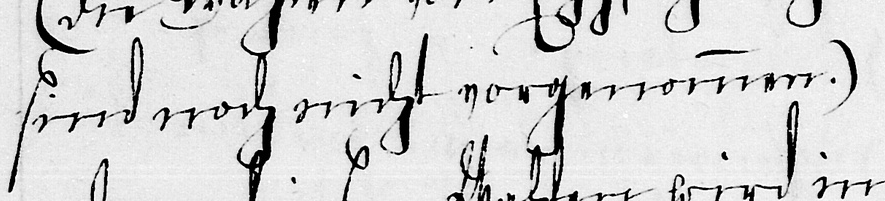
sind noch nicht vorgenommen.)
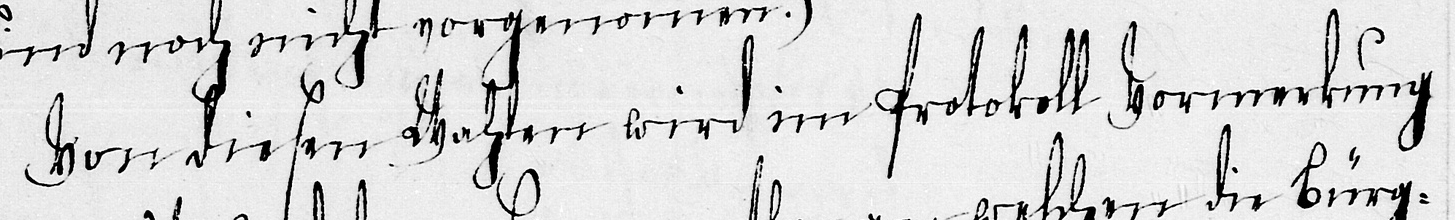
Von diesen Wahlen wird im Protokoll Vormerkung
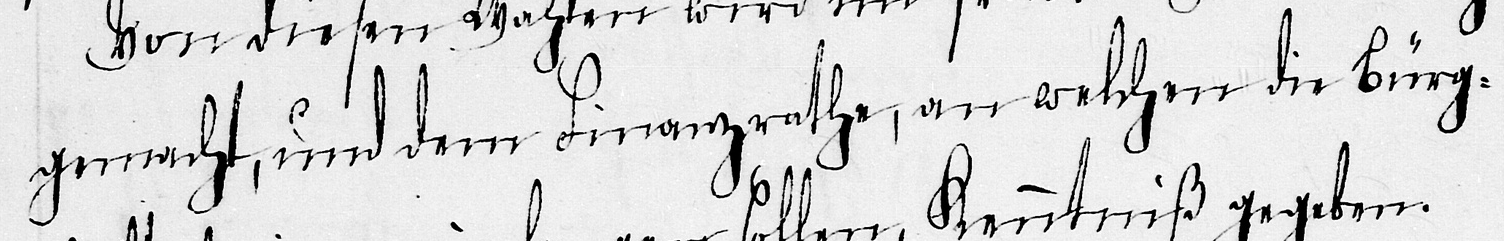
gemacht, und dem Finanzrathe, an welchen die Bürg¬
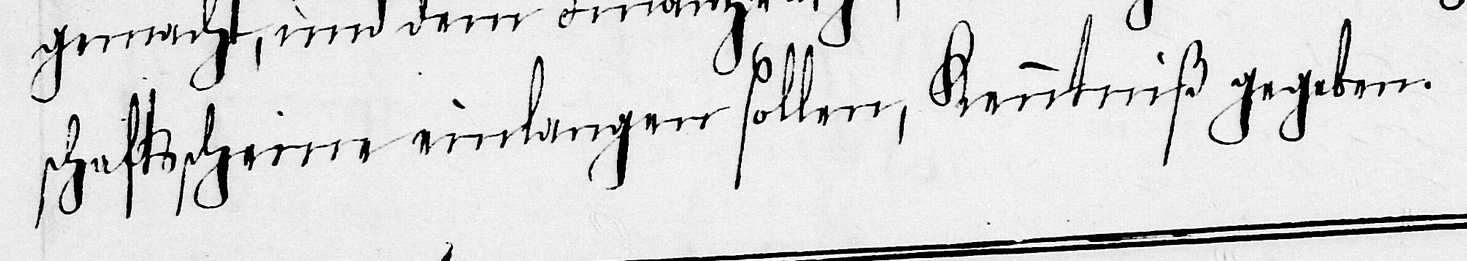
schaftsscheine einlangen sollen, Kenntniß gegeben.
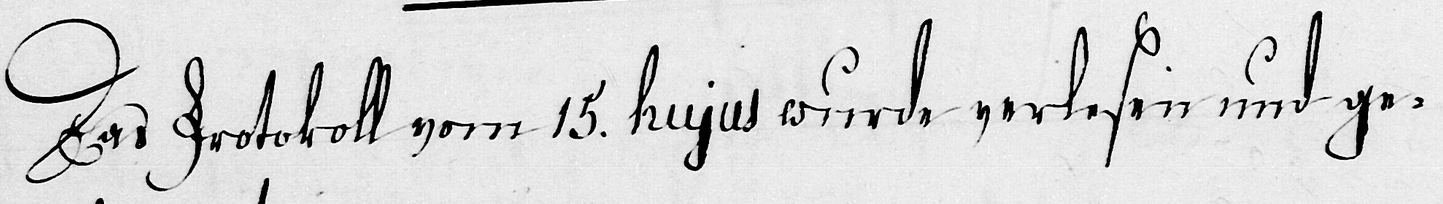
Das Protokoll vom 15. hujus wurde verlesen und ge¬
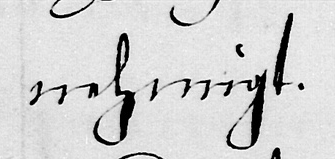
nehmigt.
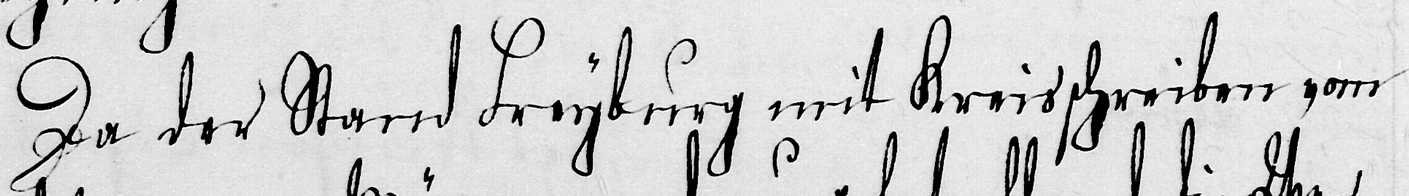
Da der Stand Freyburg mit Kreisschreiben vom
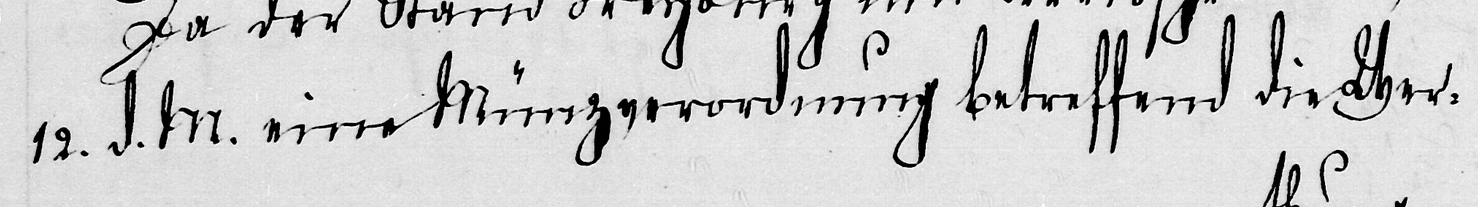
12. d. M. eine Münzverordnung betreffend die Wer-
